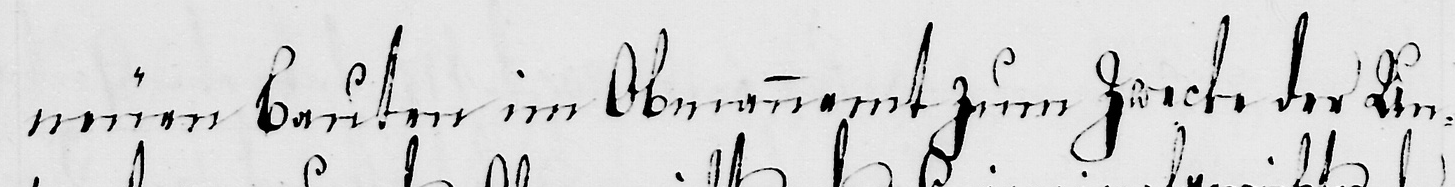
neuen Bauten im Obmannamt zum Zwecke der Un¬
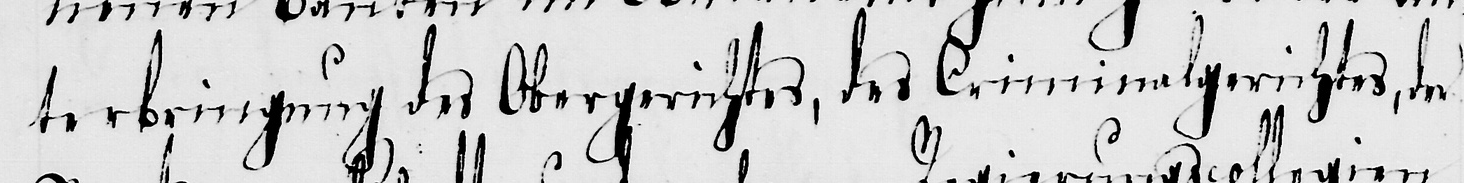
terbringung des Obergerichtes, des Criminalgerichtes, der
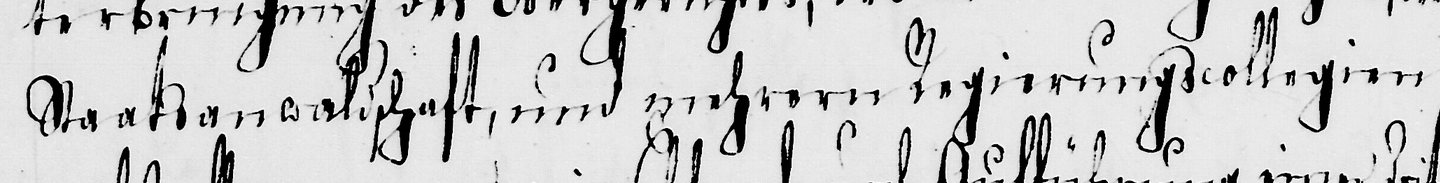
Staatsanwaldschaft, und mehrern Regierungscollegien
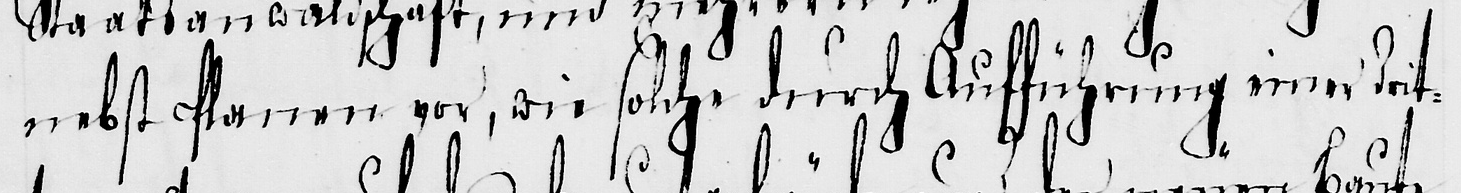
nebst Planen vor, wie solche durch Aufführung einer dri¬
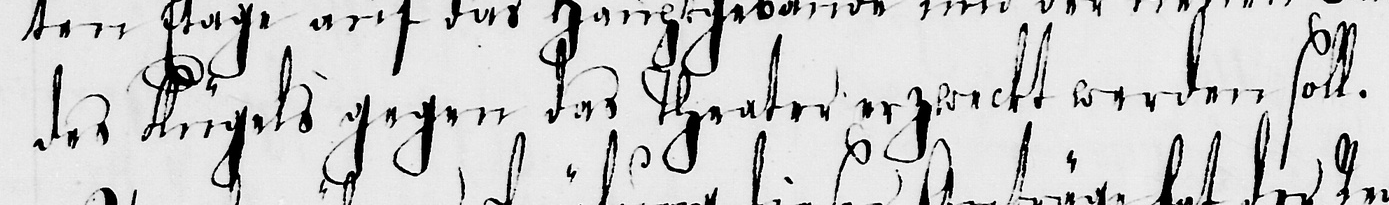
des Flügels gegen das Theater erzweckt werden soll.
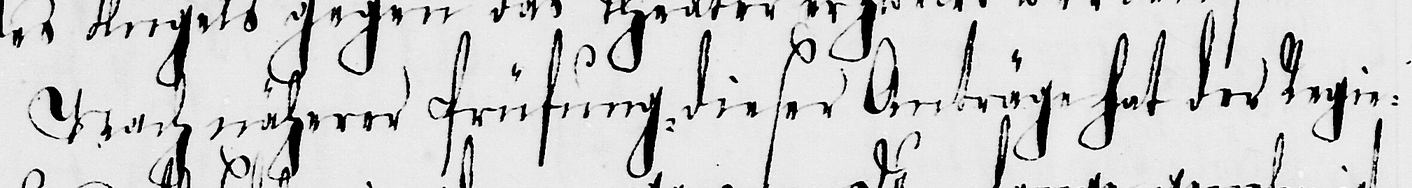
Nach näherer Prüfung dieser Anträge hat der Regier¬
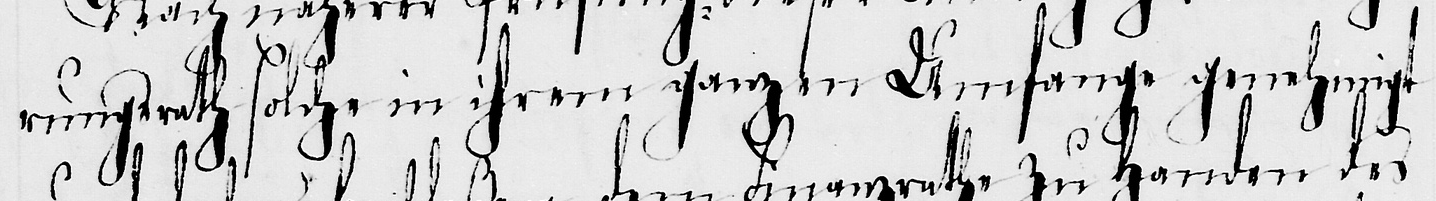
ungsrath solche in ihrem ganzen Umfange genehmigt
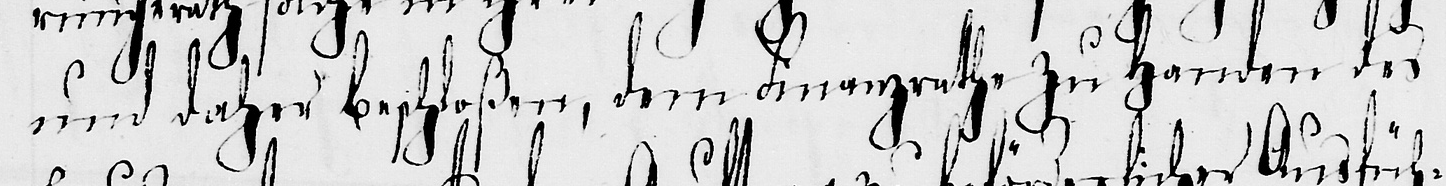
und daher beschloßen, dem Finanzrathe zu Handen des
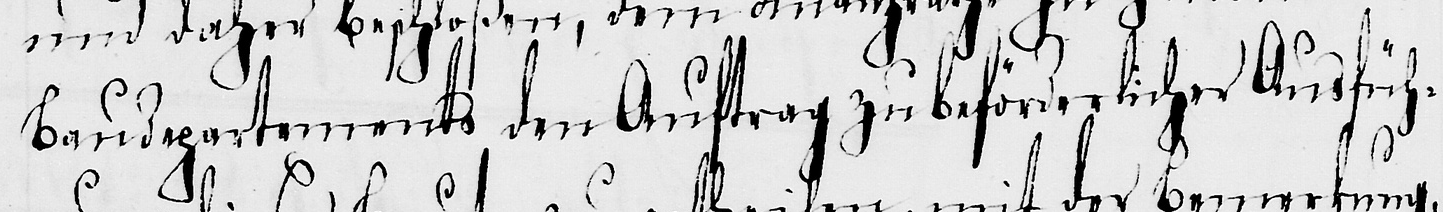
Baudepartements den Auftrag zu beförderlicher Ausfüh¬
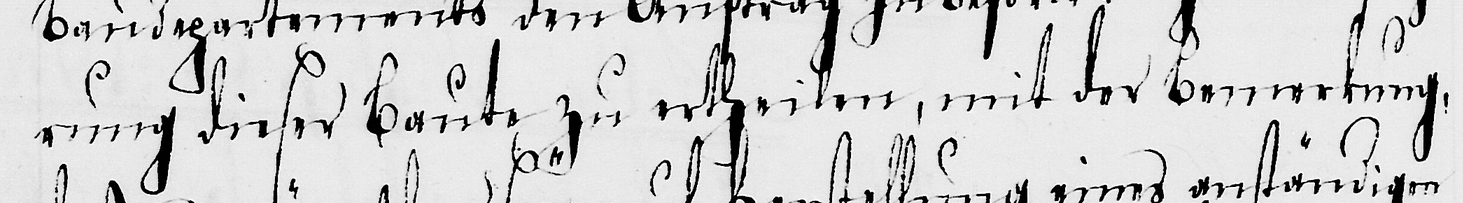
rung dieser Baute zu ertheilen, mit der Bemerkung,
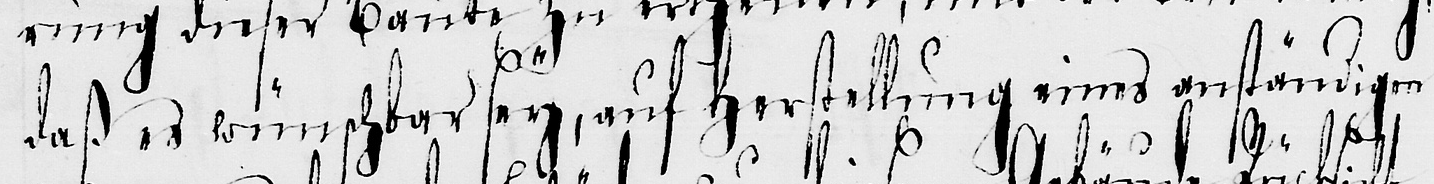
daß es wünschbar sey, auf Herstellung eines anständigen
